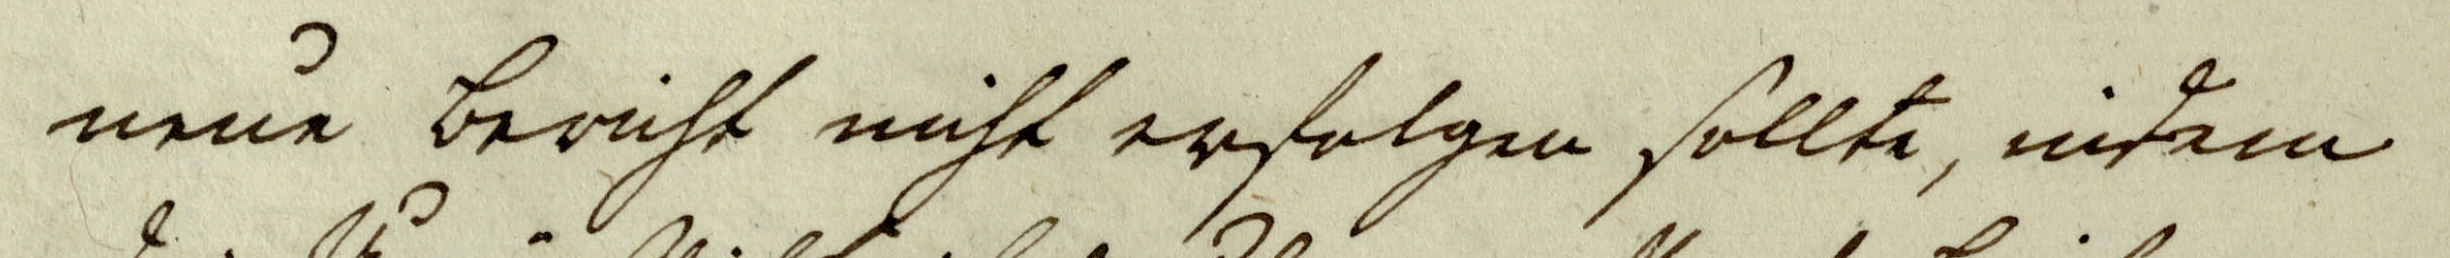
neue Bericht nicht erfolgen sollte, indem
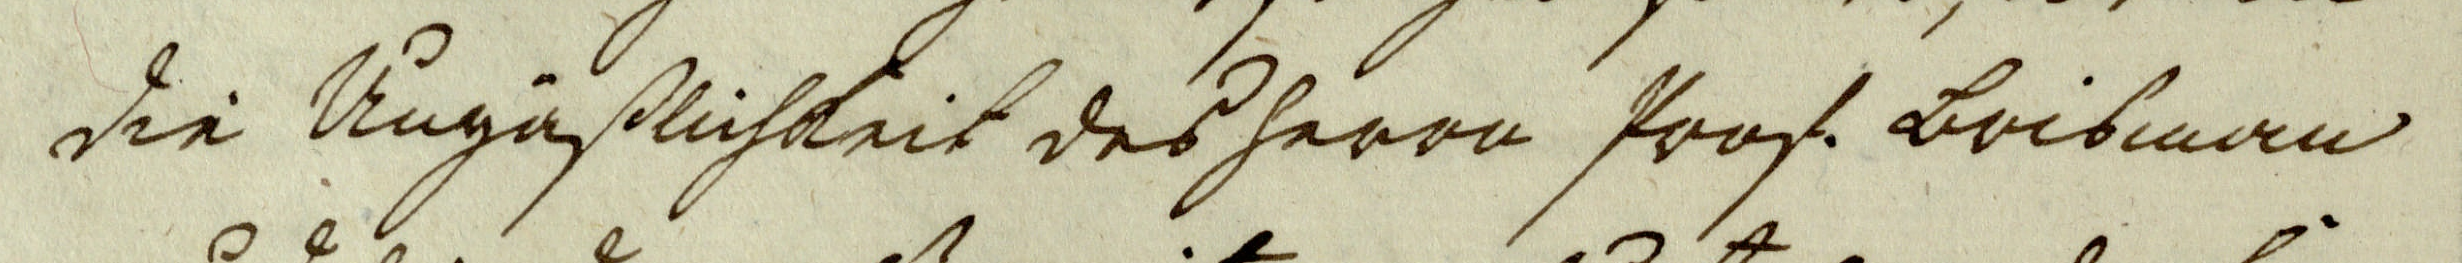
die Unpäßlichkeit des Herrn Prof. Brisman
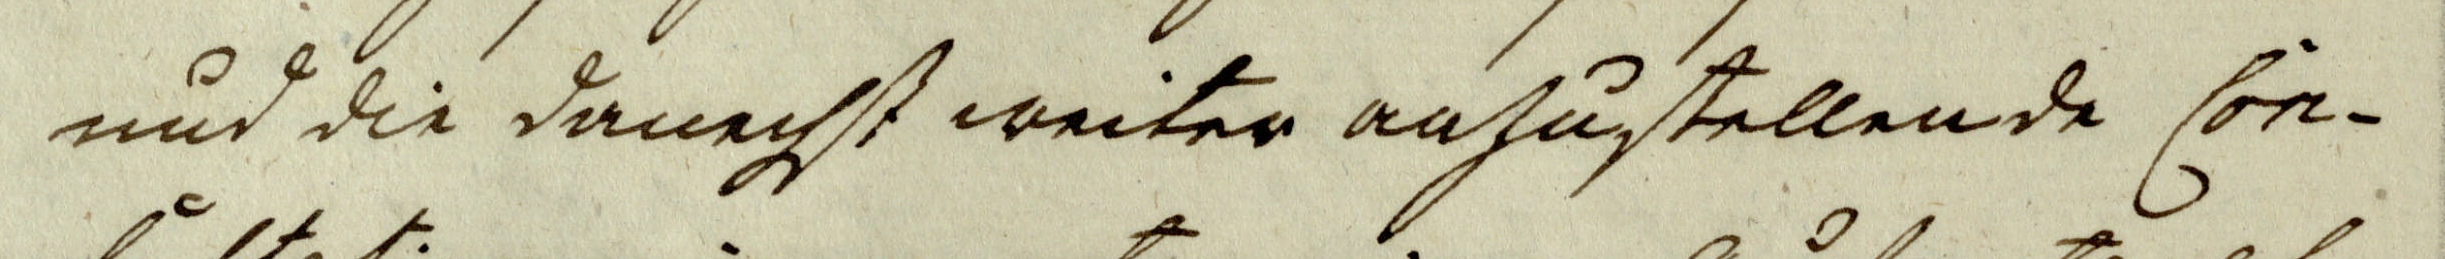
und die danechst weiter anzustellende Con¬
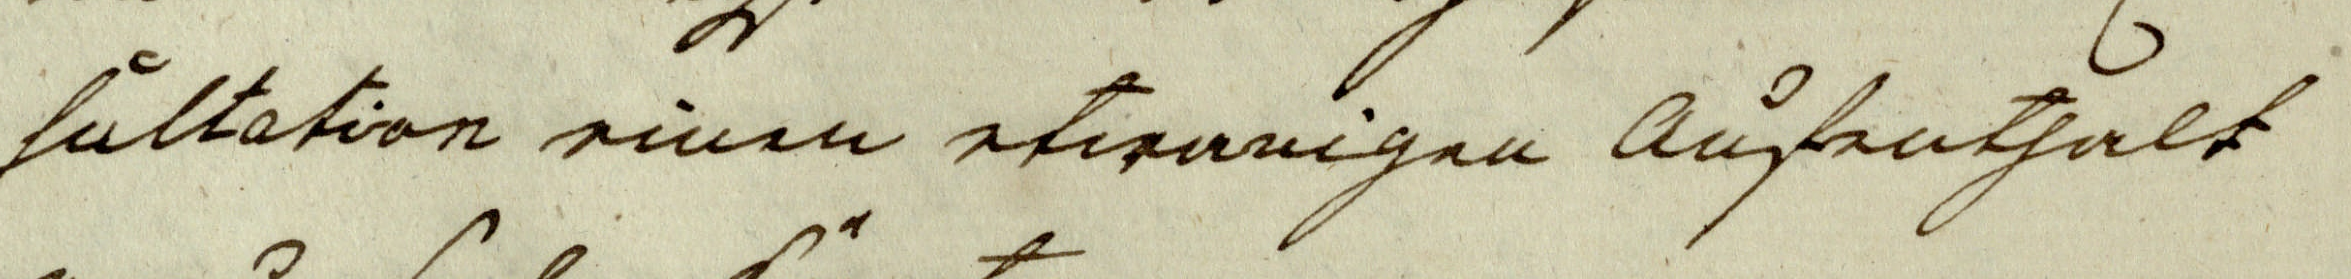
sultation einen etwanigen Aufenthalt
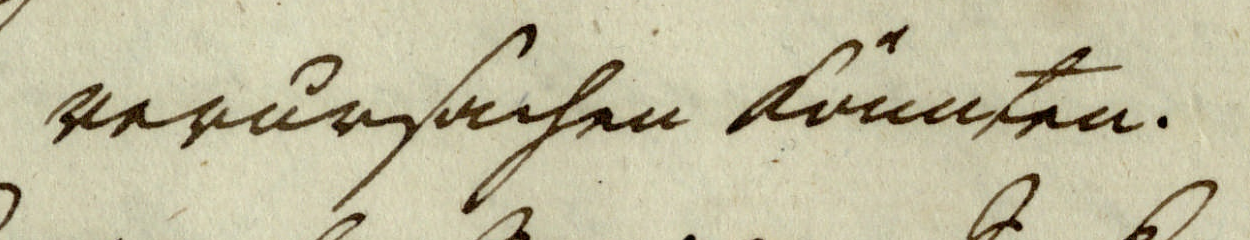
verursachen könnten.
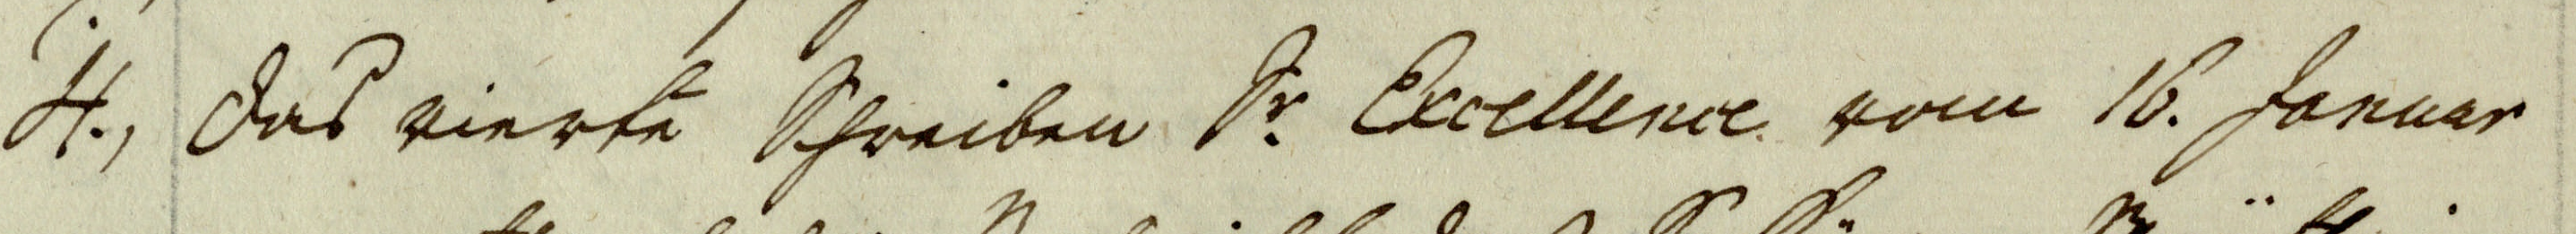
4., Das vierte Schreiben Sr. Excellence vom 16. Januar
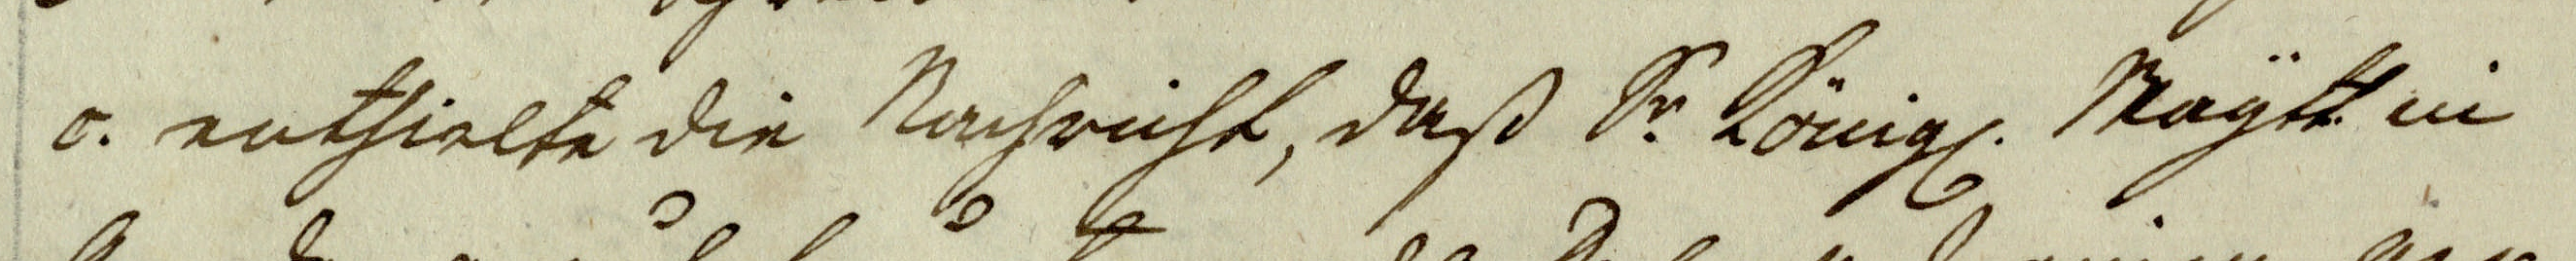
c. enthielte die Nachricht, daß Sr Königl. Maÿtt in
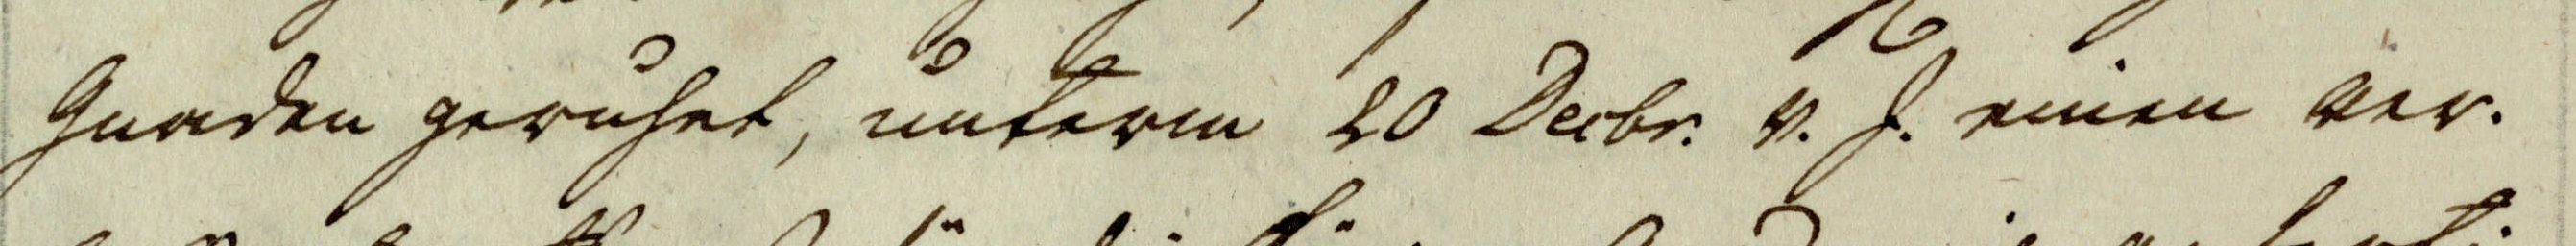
Gnaden geruhet, unterm 20 Decbr. v. J. einen ver¬
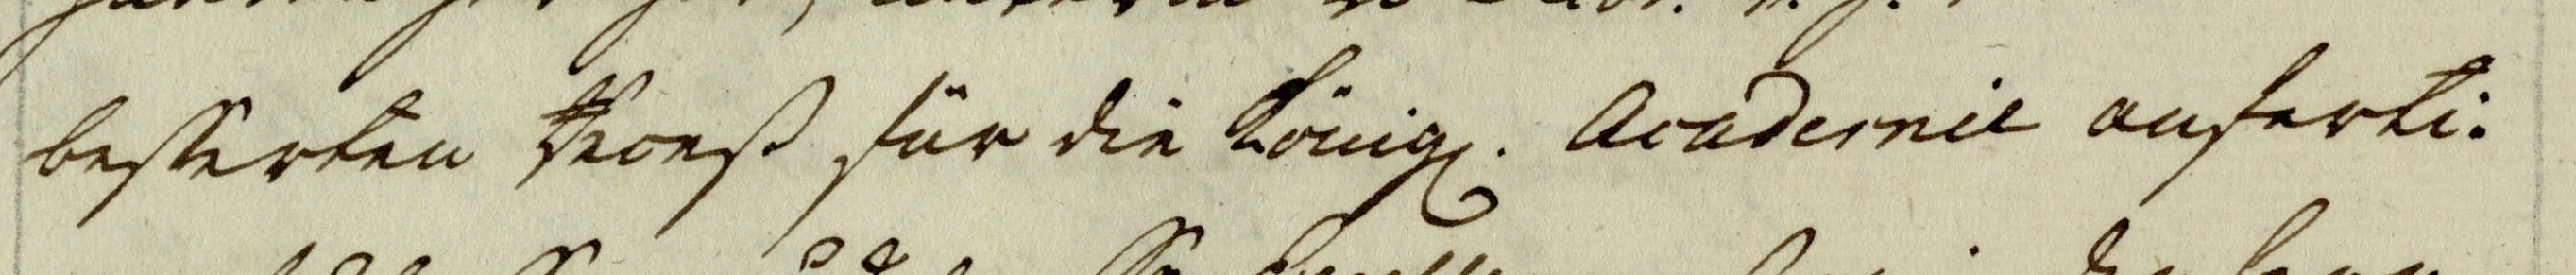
besserten Receß für die Königl. Academie anferti¬
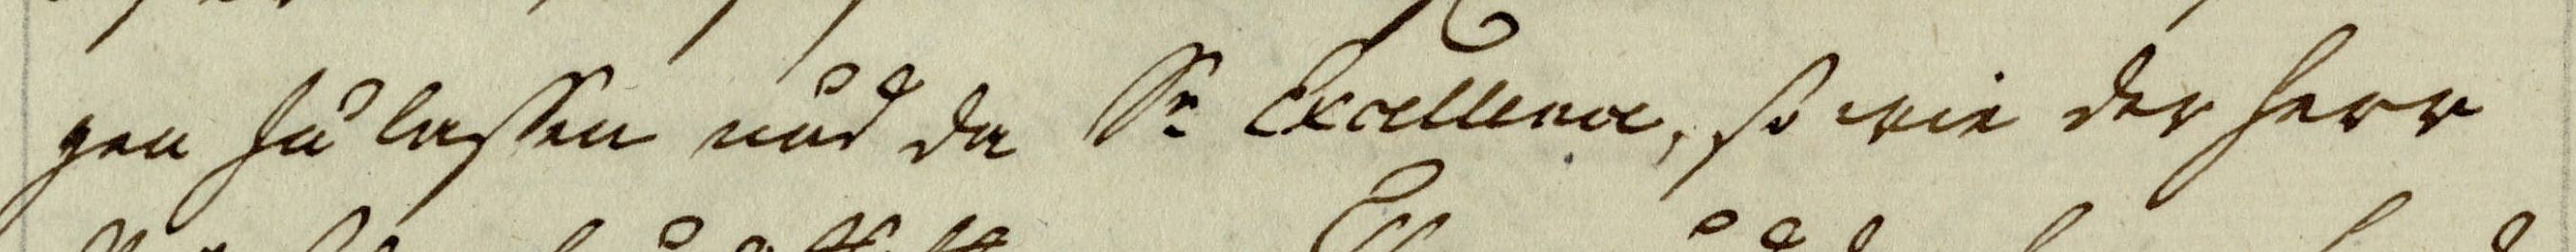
gen zu lassen und da Sr Excellence, so wie der Herr
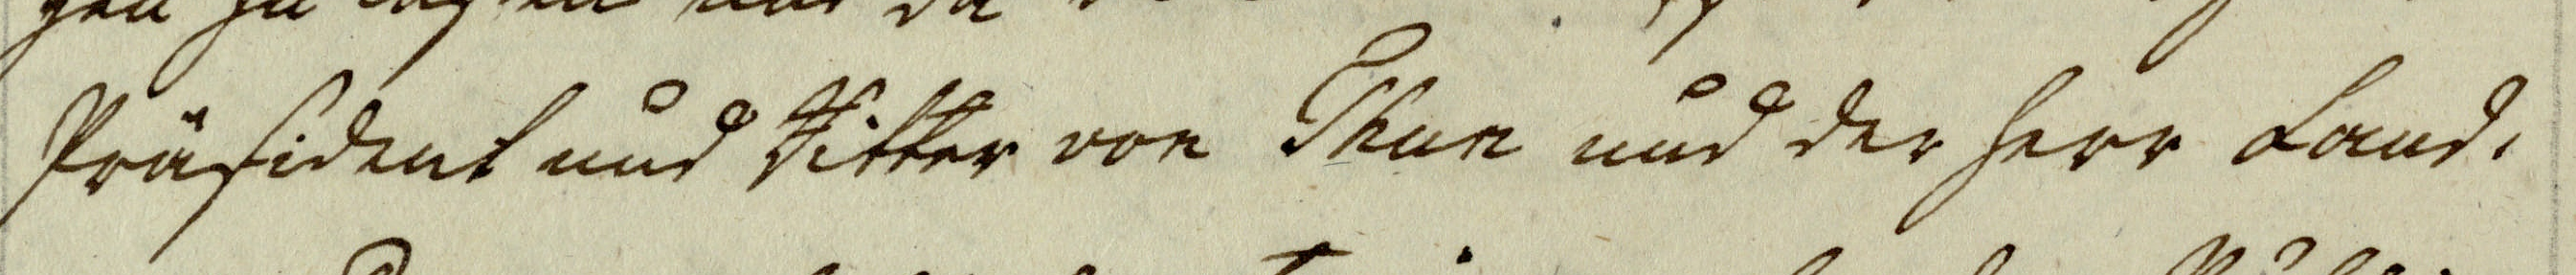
Präsident und Ritter von Thun und der Herr Land¬
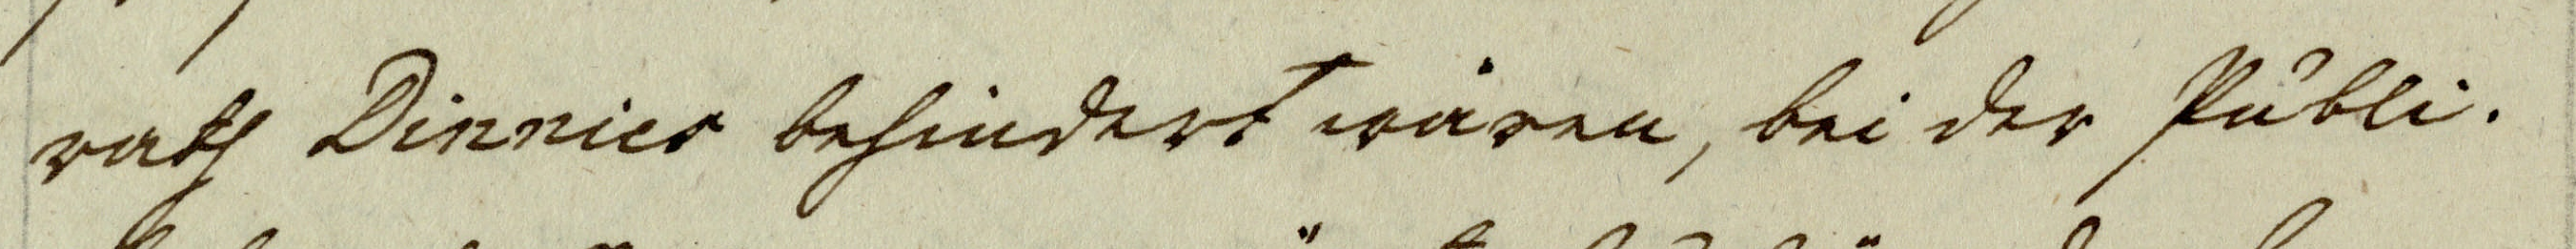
rath Dinnies behindert wären, bei der Publi¬
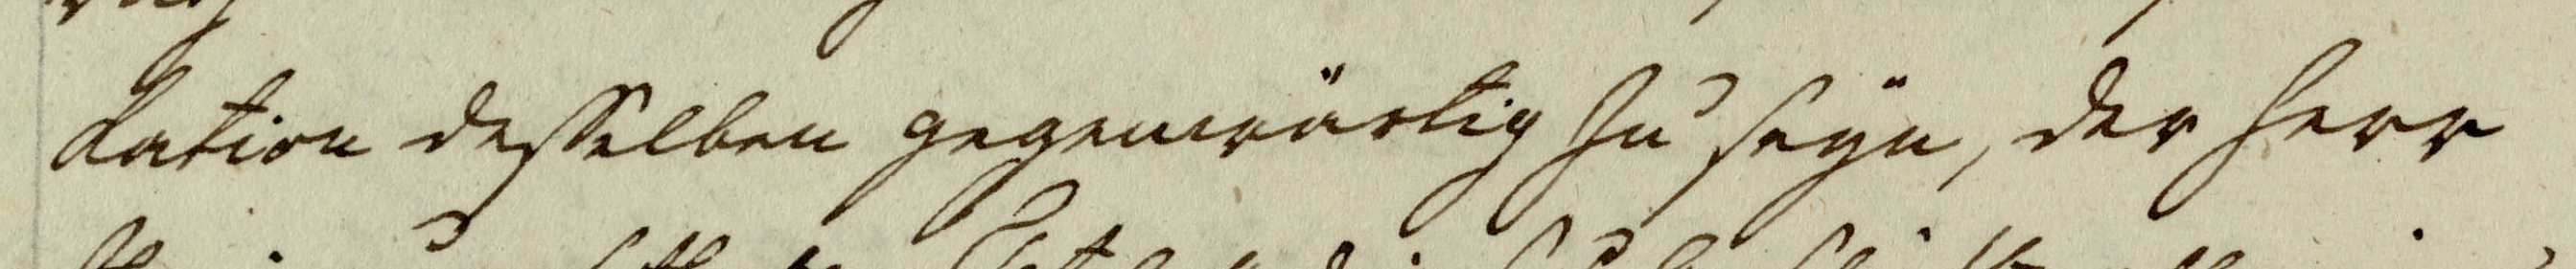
kation desselben gegenwärtig zu seÿn, der Herr
